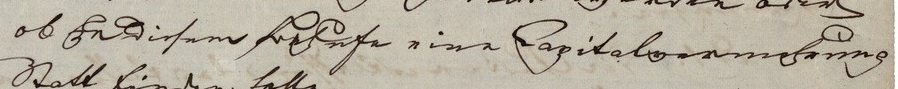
ob zu diesem Behufe eine Capitalvermehrung
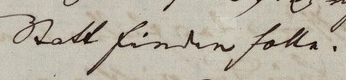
Statt finden solle.
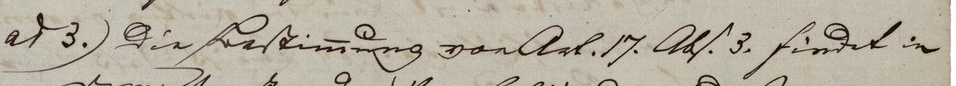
ad 3.) Die Bestimmung von Art. 17. Abs. 3. findet in
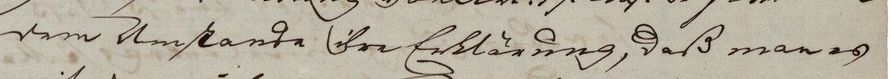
dem Umstande ihre Erklärung, daß man es
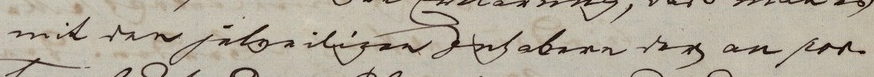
mit den jeweiligen Inhabern der an por-
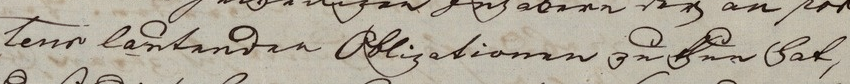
teur lautenden Obligationen zu thun hat,
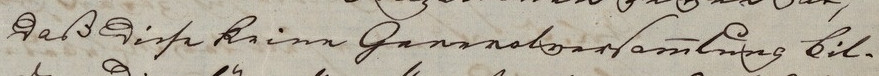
daß diese keine Generalversammlung bil-
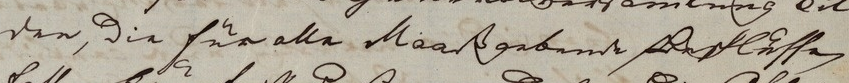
den, die für alle Maaß gebende Beschlüsse
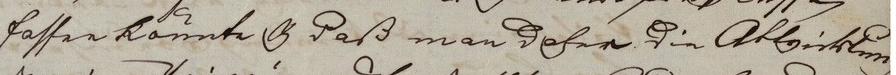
fassen könnte & daß man daher die Abwicklung
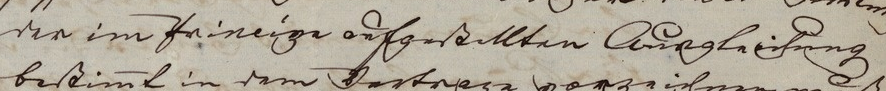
der im Principe aufgestellten Ausgleichung
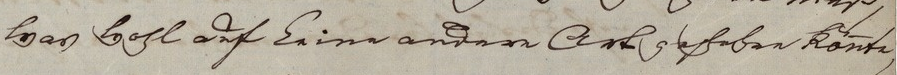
was wohl auf keine andere Art geschehen könnte,
